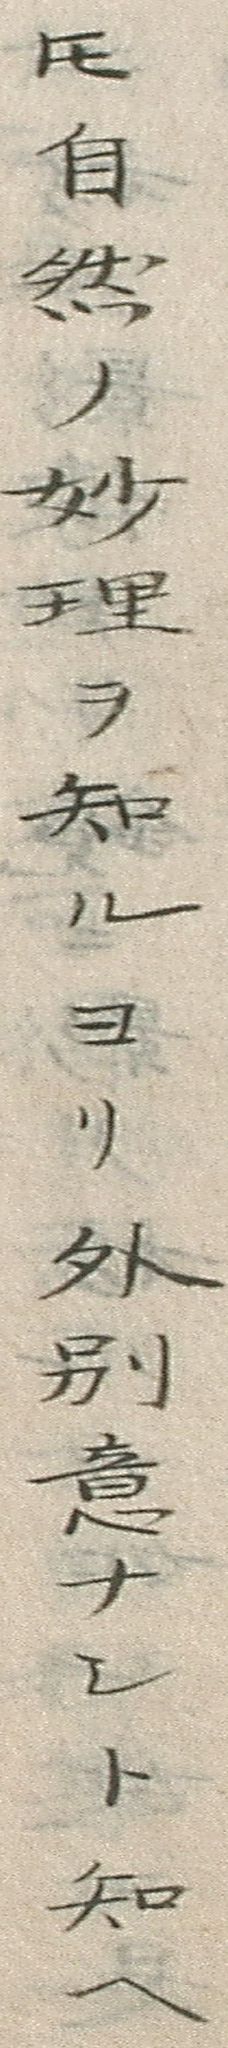トモ自然ノ妙理ヲ知ルヨリ外別意ナシト知ヘ
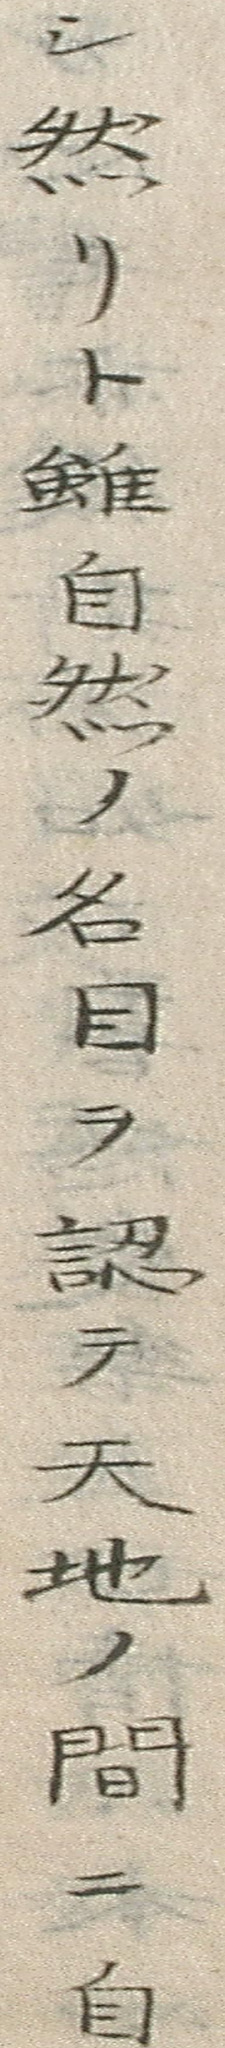シ然リト雖自然ノ名目ヲ認テ天地ノ間ニ自
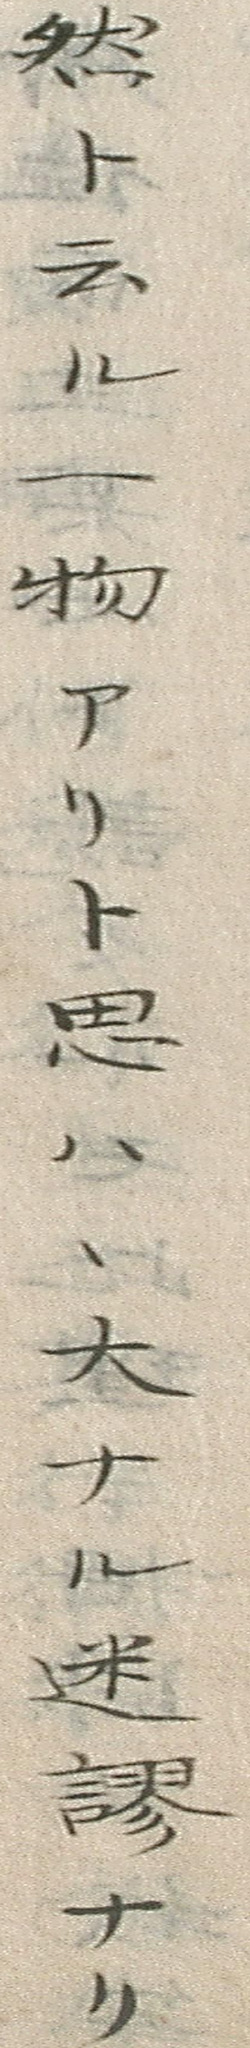然ト云ル一物アリト思ハヽ大ナル迷謬ナリ
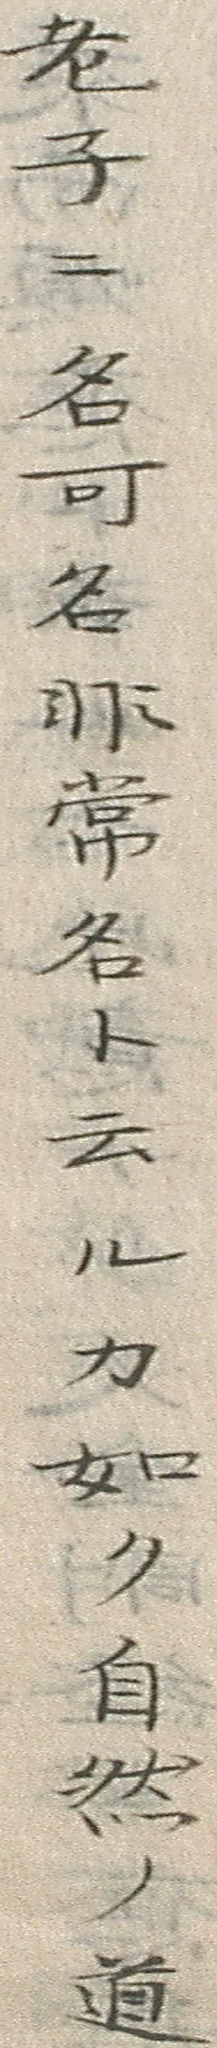老子ニ名可名非常名ト云ルカ如ク自然ノ道
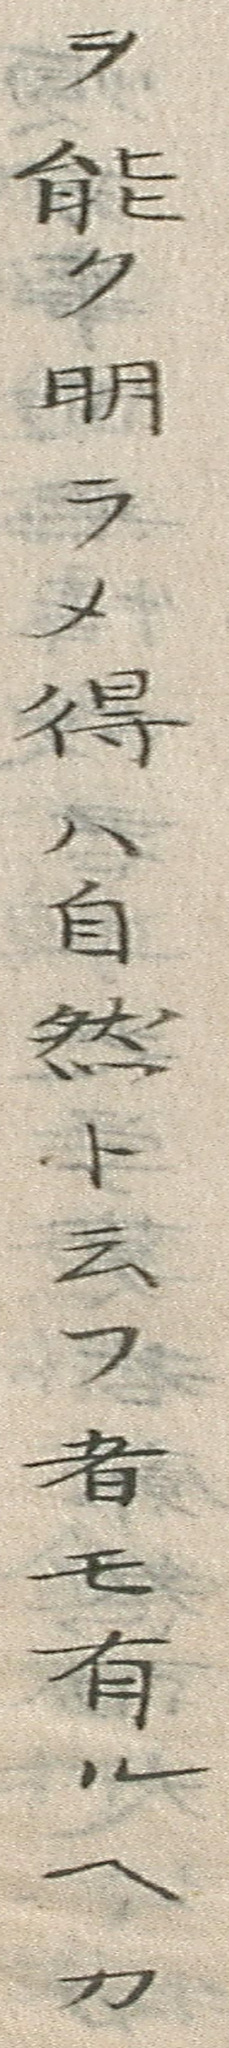ヲ能ク明ラシテ得ハ自然ト云フ者モ有ルヘカ
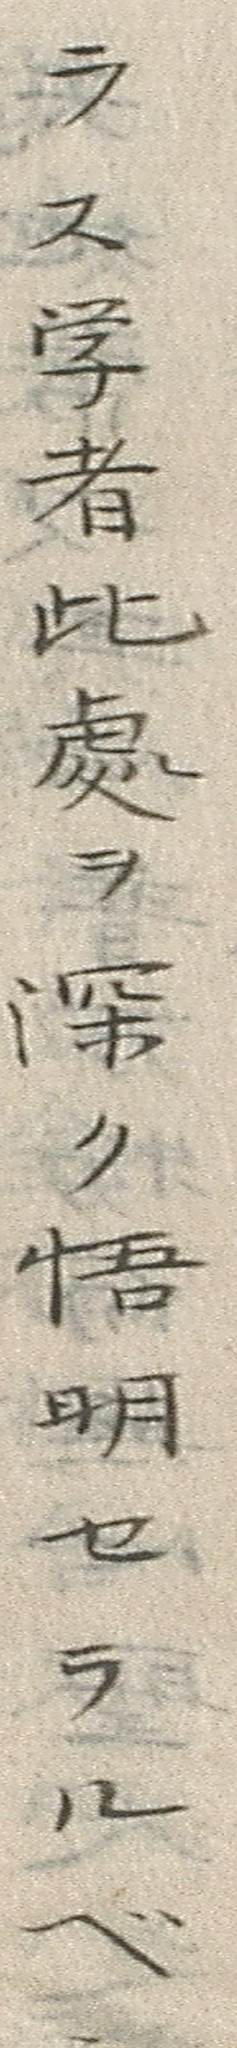ラス学者此処ヲ深ク悟明セラルベシ
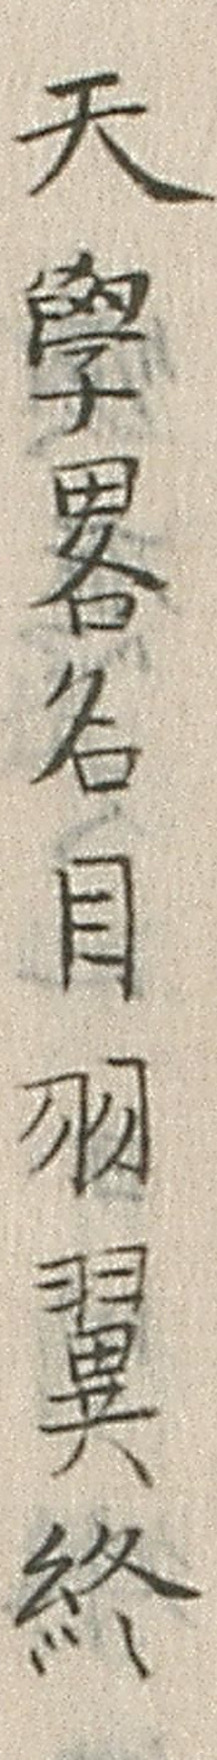天学略名目羽翼終
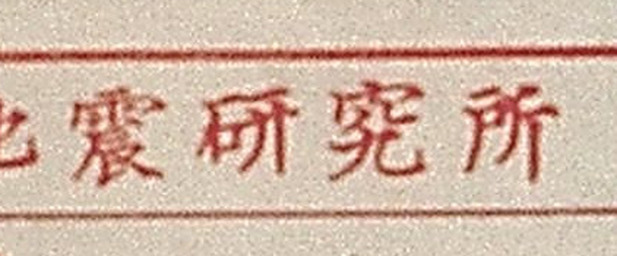地震研究所
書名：天學略名目羽翼　全
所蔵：東京大学地震研究所図書室 Earthquake Research Institute Library, The University of Tokyo, JAPAN
